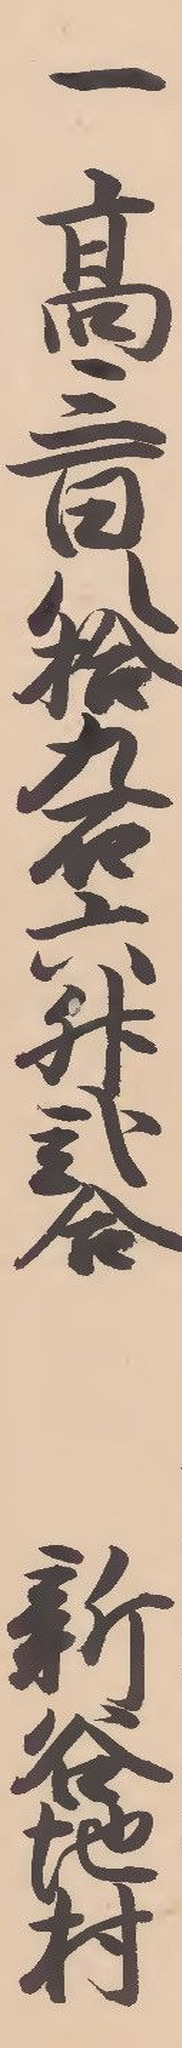一高三百八拾九石六升弐合新谷地村
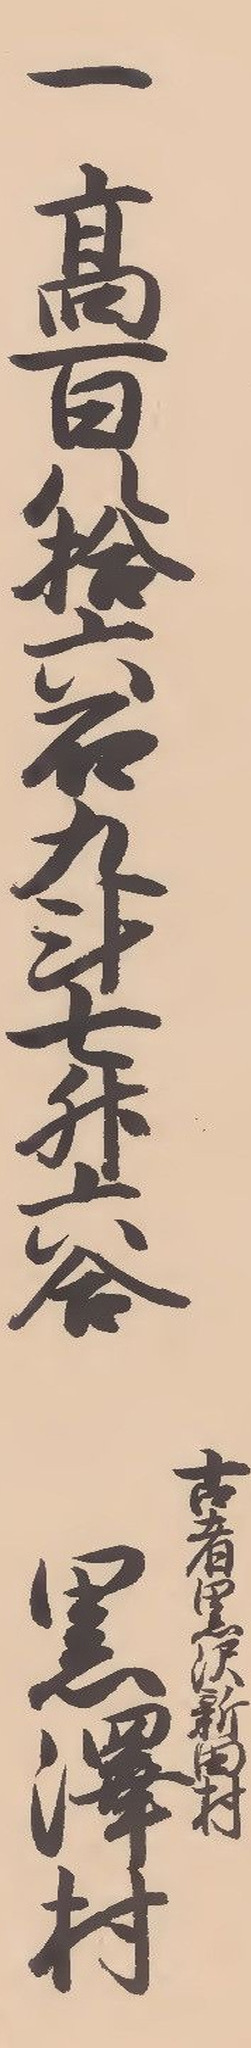一高百八拾六石九斗七升六合黒沢村
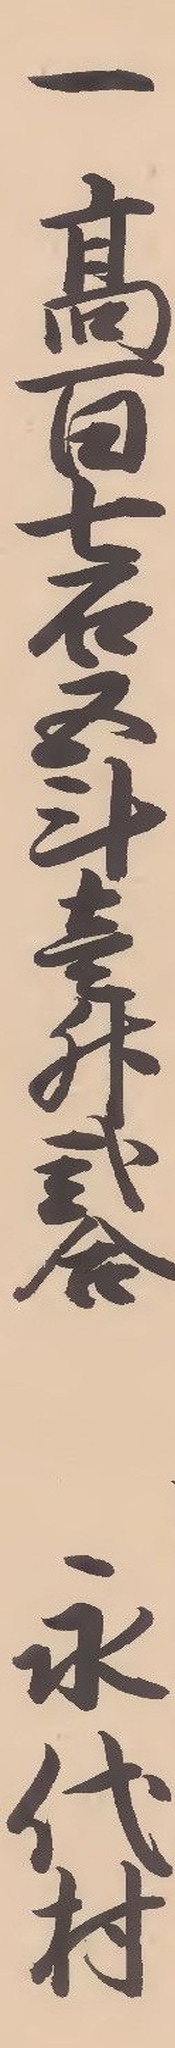一高百七石五斗壱升弐合永代村
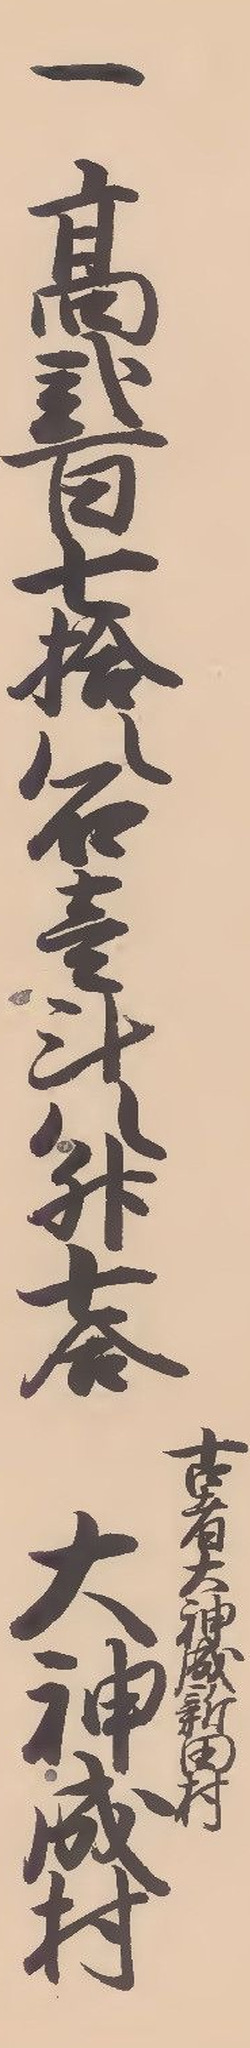一高弐百七拾八石壱斗八升七合大神成村

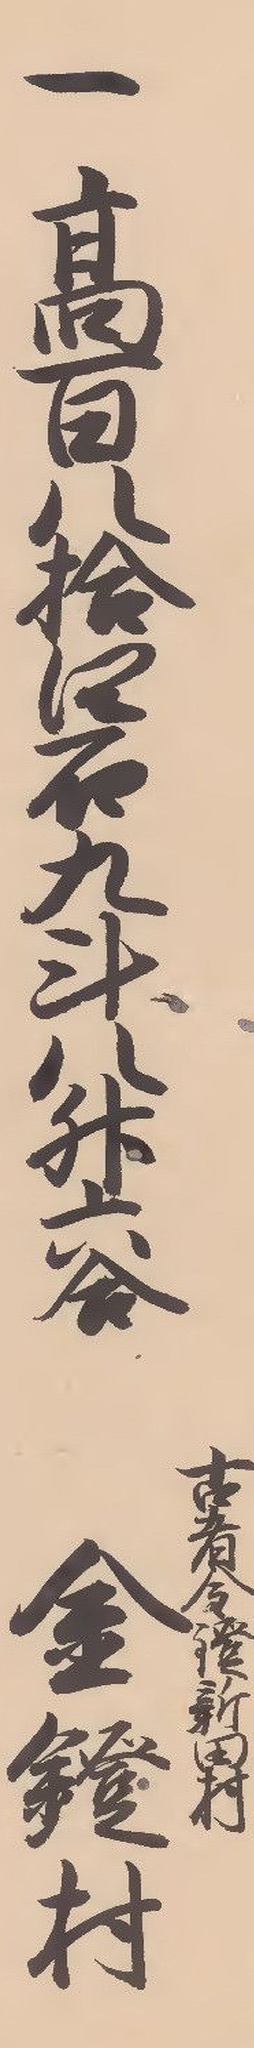一高百八拾四石九斗八升六合金鐙村
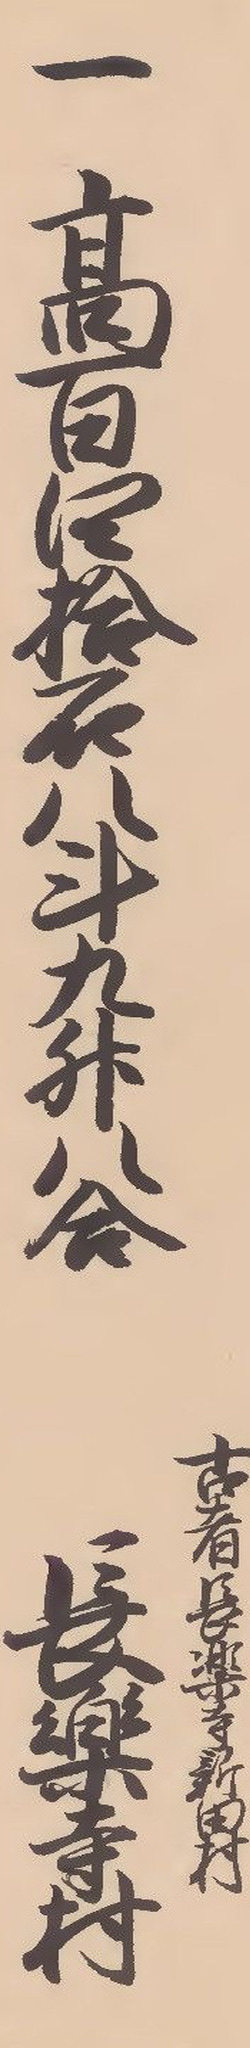一高百四拾石八斗九升八合長楽寺村
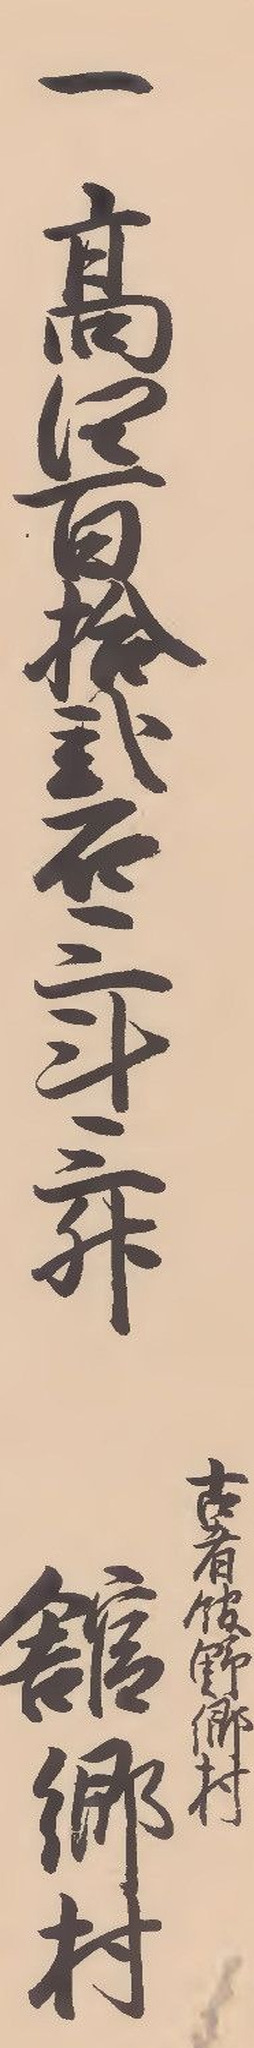一高四百拾弐石三斗三升館郷村
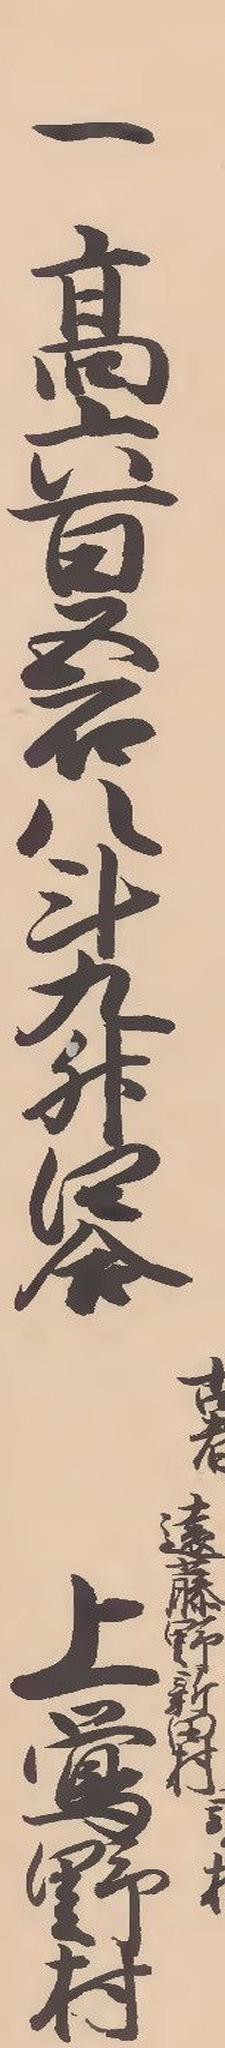一高六百五石八斗九升四合上鶯野村
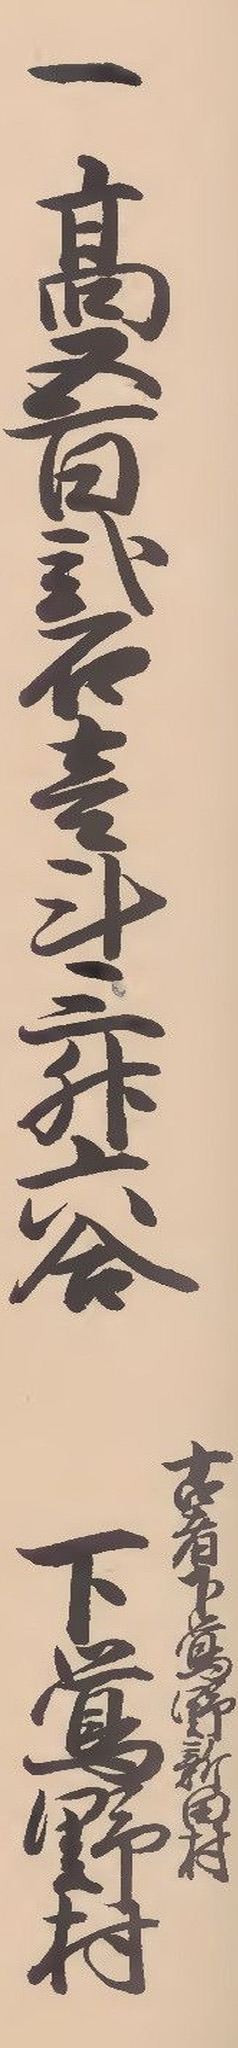一高五百弐石壱斗三升六合下鶯野村
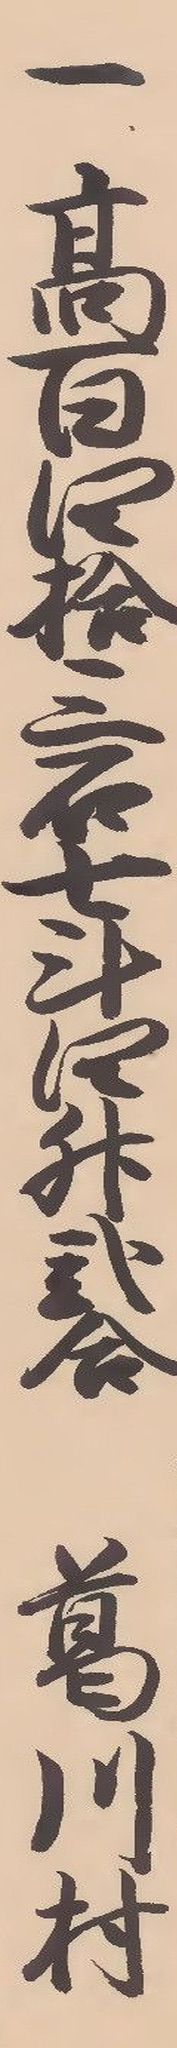一高百四拾三石七斗四升弐合葛川村
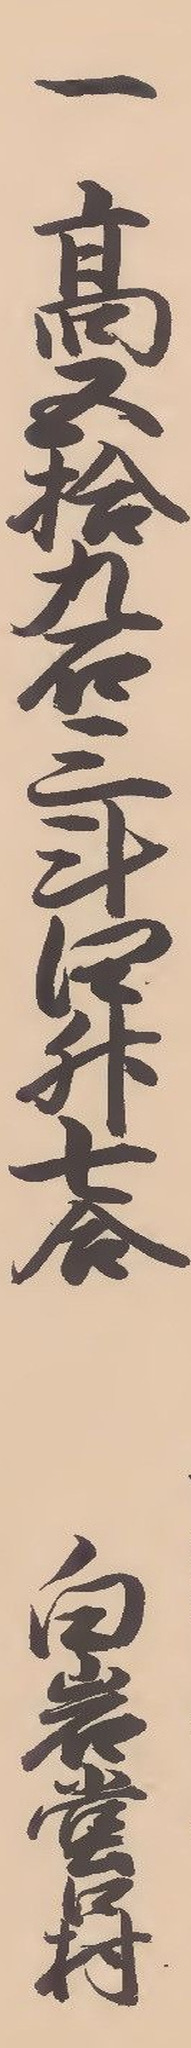一高五拾九石三斗四升七合白岩堂口村
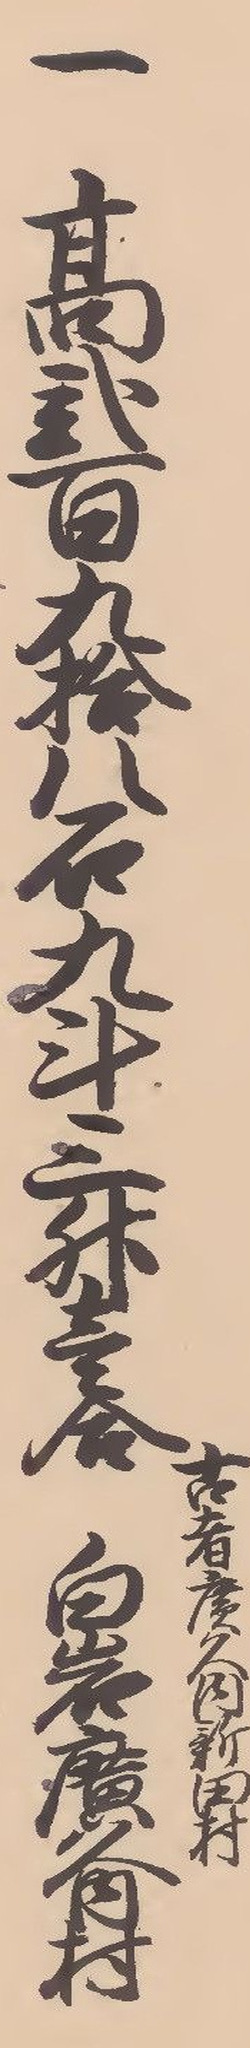一高弐百九拾八石九斗三升壱合白岩広久内村

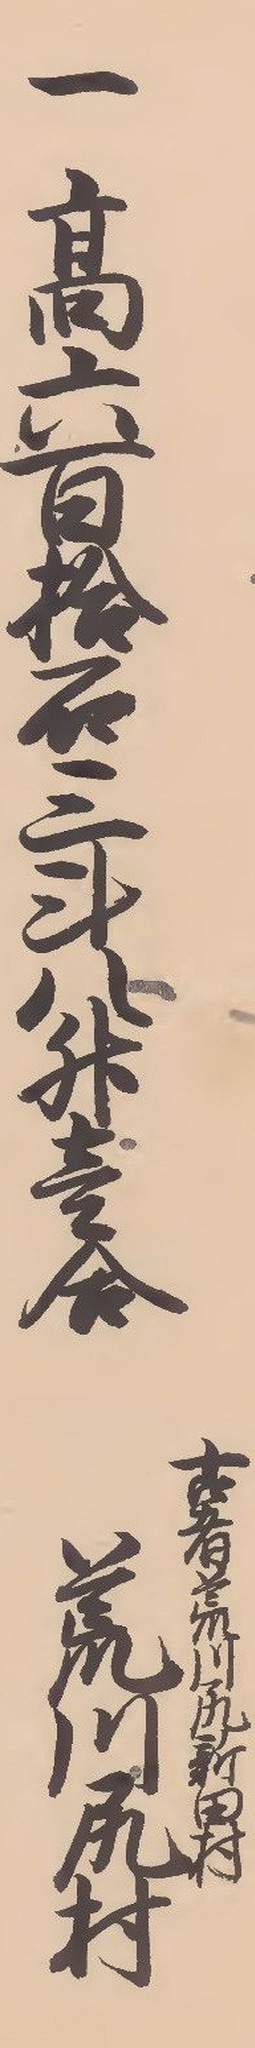一高六百拾石三斗八升壱合荒川尻村
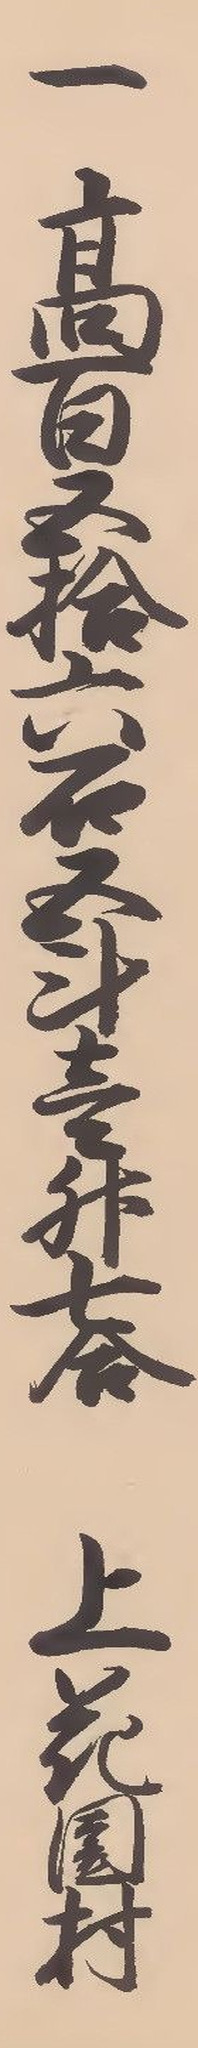一高百五拾六石五斗壱升七合上花園村
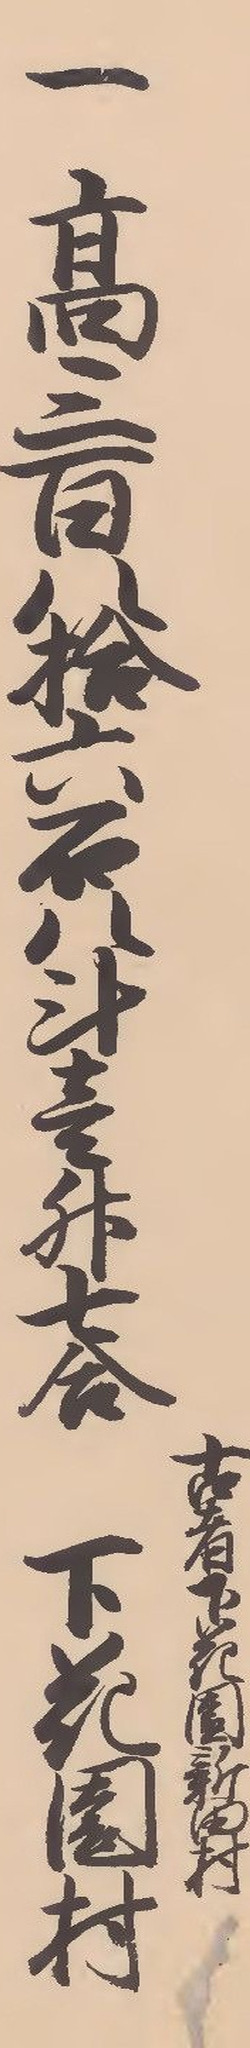一高三百八拾六石八斗壱升七合下花園村
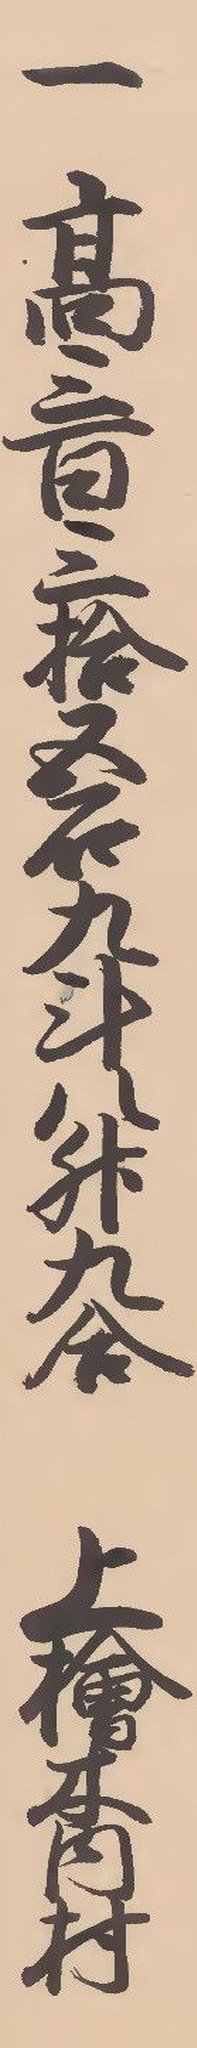一高三百三拾五石九斗八升九合上桧木内村
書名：出羽国郷帳　５
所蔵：国立公文書館 National Archives of Japan
